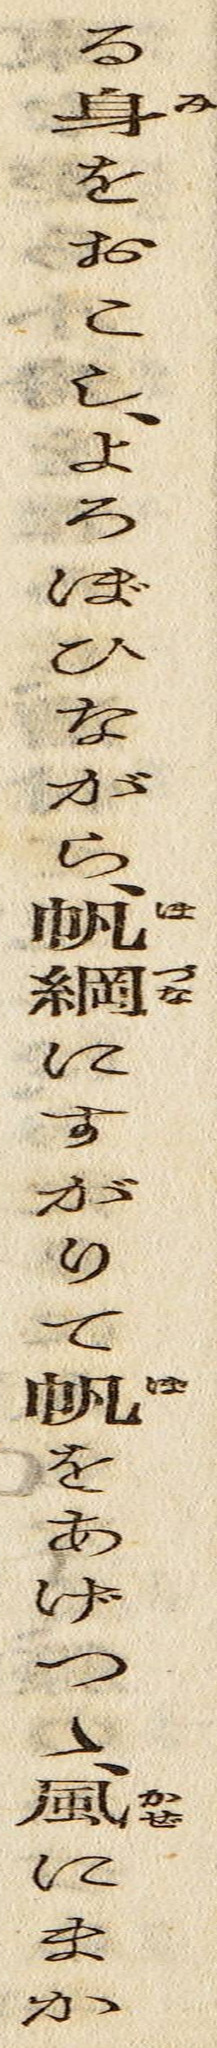る身をおこし、よろぼひながら、帆綱にすがりて帆ぼをあげつゝ、風にまか
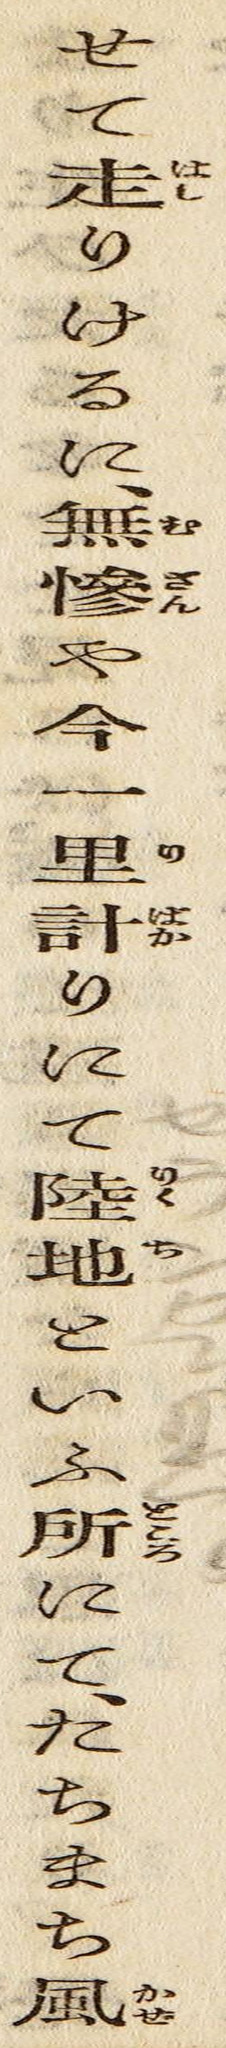せて走りけるに、無惨や今一里計りにて陸地といふ所にて、たちまち風
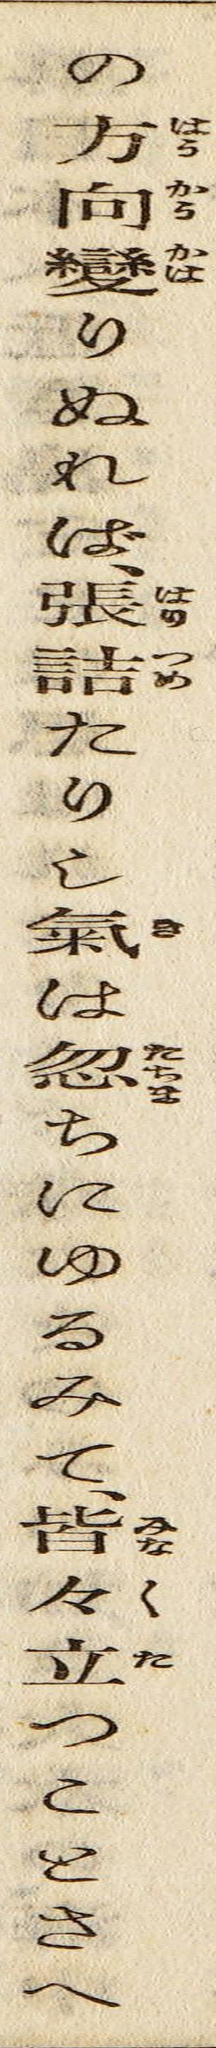の方向変りぬれば、張詰たりし気は忽ちにゆるみて、皆々立つことさへ
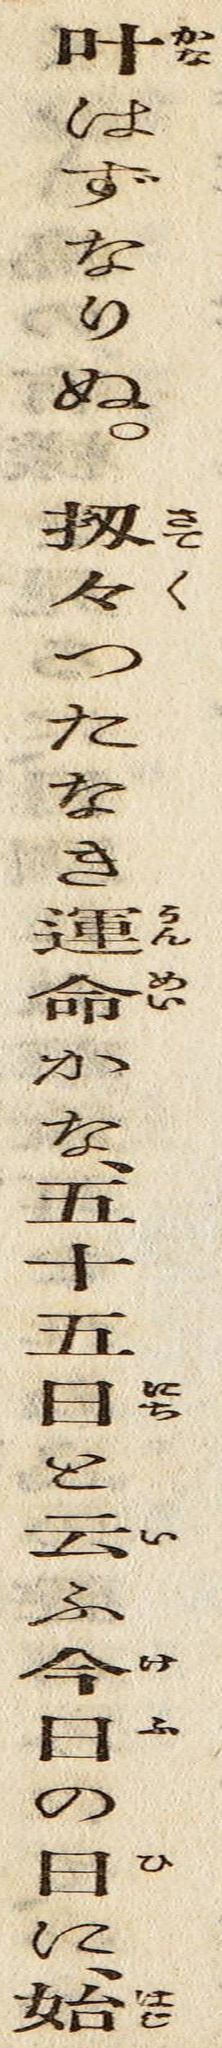叶はずなりぬ。扨々つたなき運命かな、五十五日と云ふ今日の日に、始
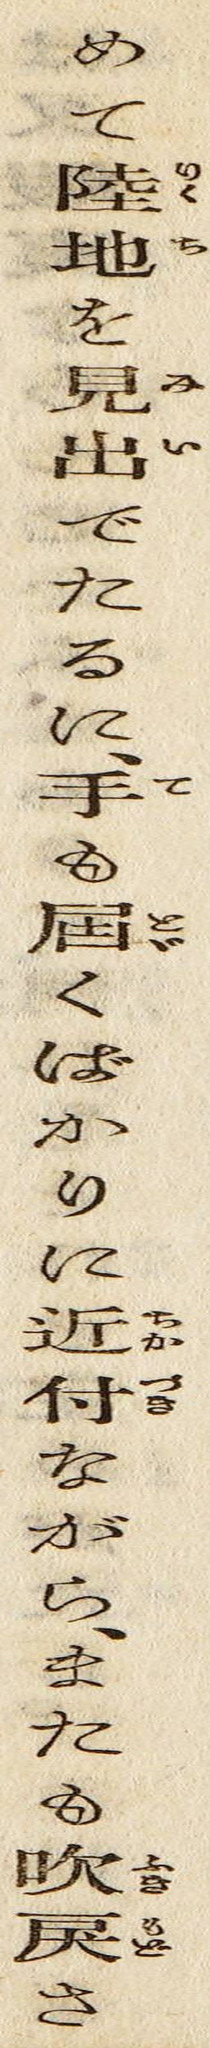めて陸地を見出でたるに、手も届くばかりに近付ながら、またも吹戻さ
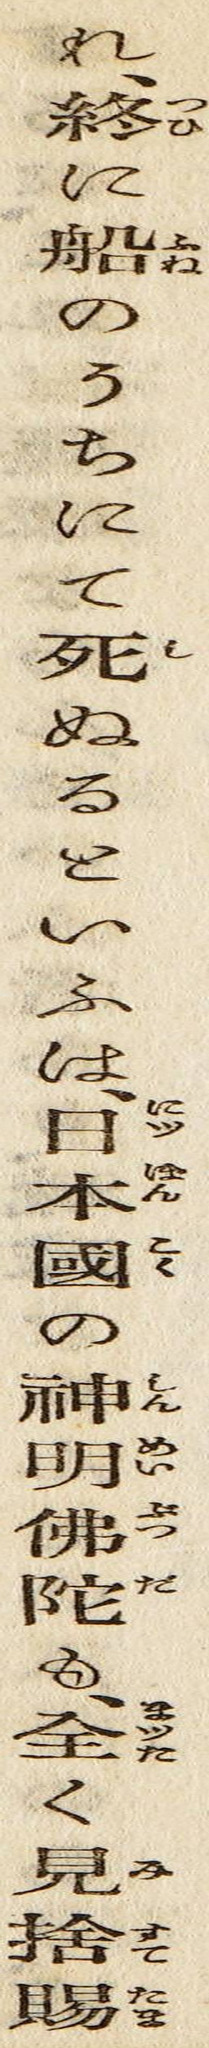れ、終に船のうちにて死ぬるといふは、日本国の神明仏陀も、全く見捨賜
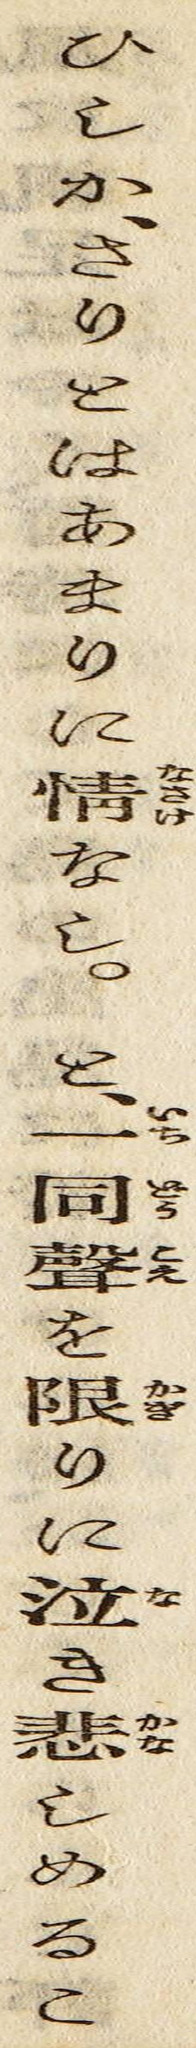ひしか、さりとはあまりに情なし。と、一同声を限りに泣き悲しめるこ
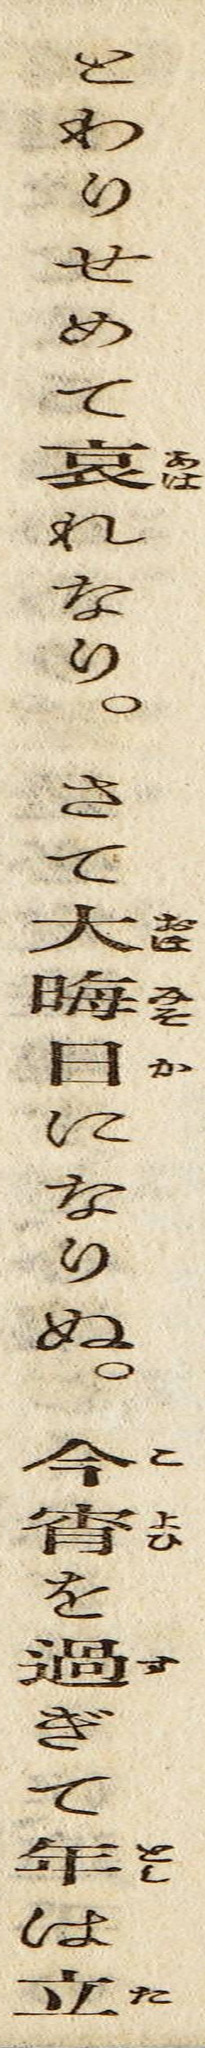とわりせめて哀れなり。さて大晦日になりぬ。今宵を過ぎて年は立
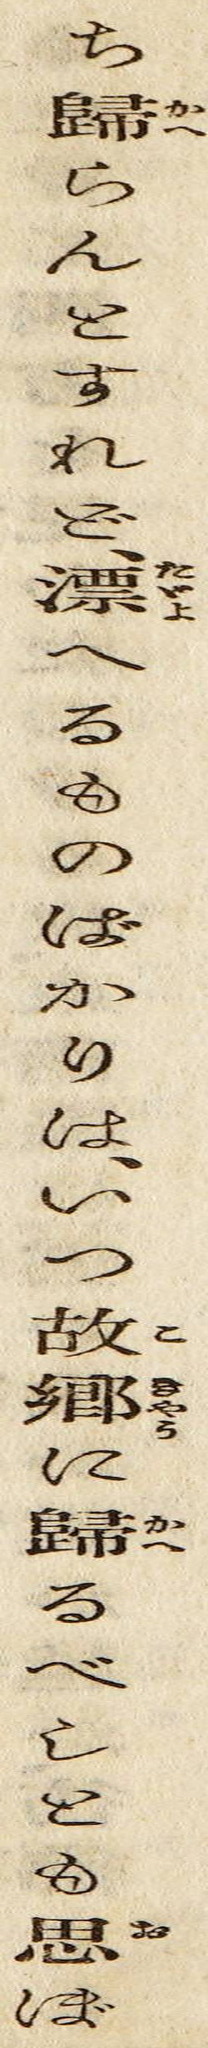ち帰らんとすれど、漂へるものばかりは、いつ故郷に帰るべしとも思ぼ
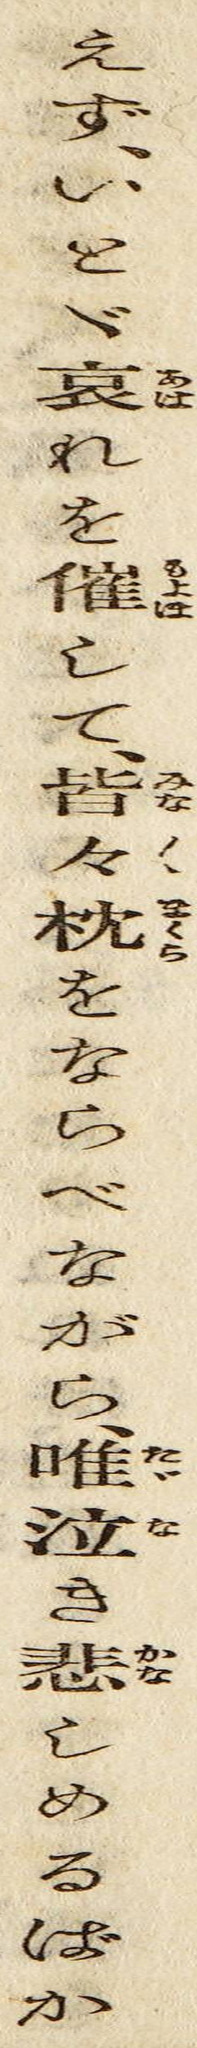えず、いとヾ哀れを催して、皆々枕をならべながら、唯泣き悲しめるばか
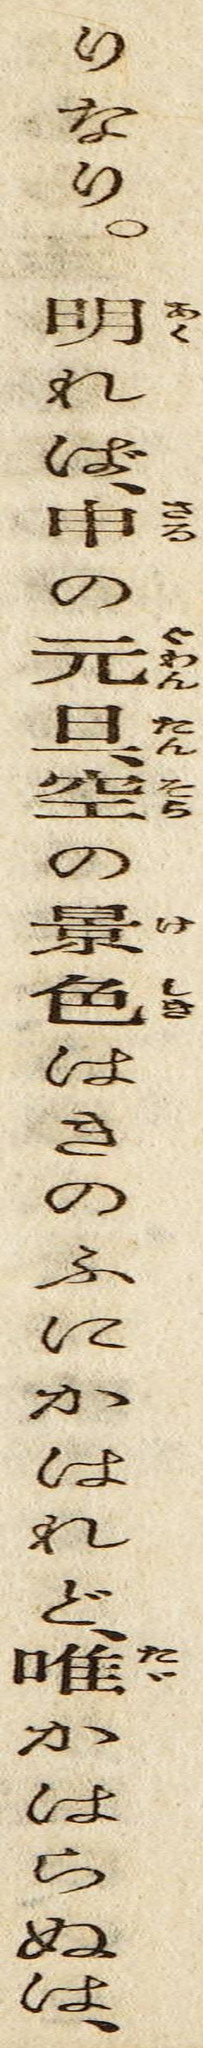りなり。明れば、申の元旦、空の景色はきのふにかはれど、唯かはらぬは、
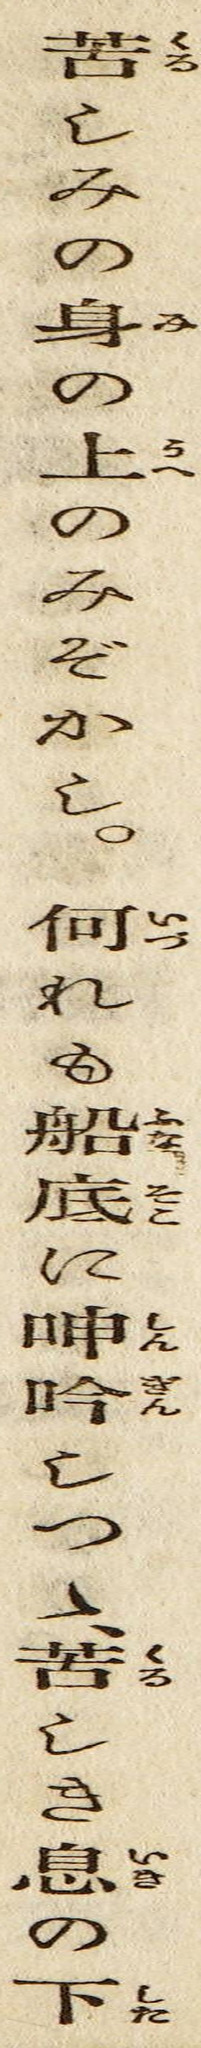苦しみの身の上のみぞかし。何れも船底に呻吟しつゝ、苦しき息の下

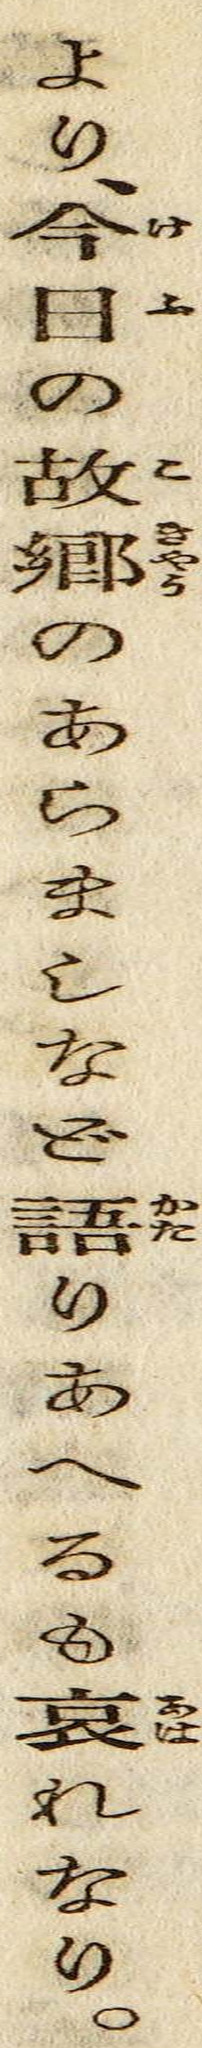より、今日の故郷のあらましなど語りあへるも哀れなり。
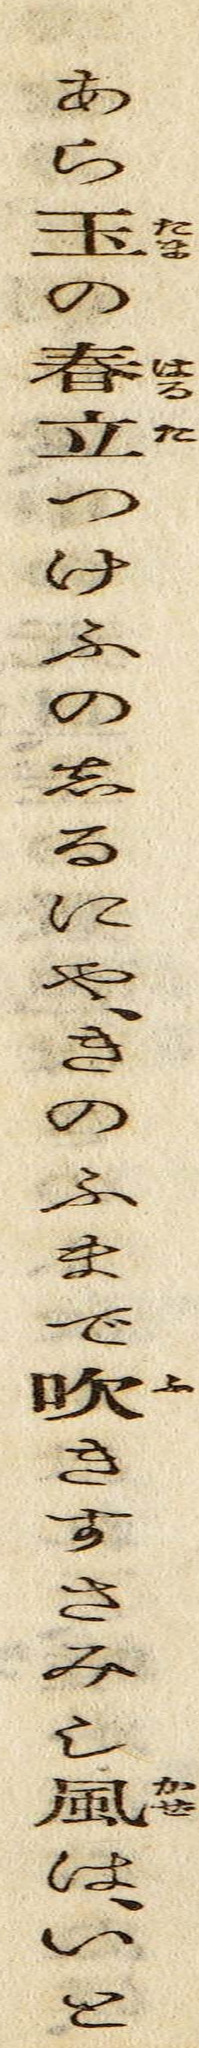あら玉の春立つけふのしるにや、きのふまで吹きすさみし風は、いと
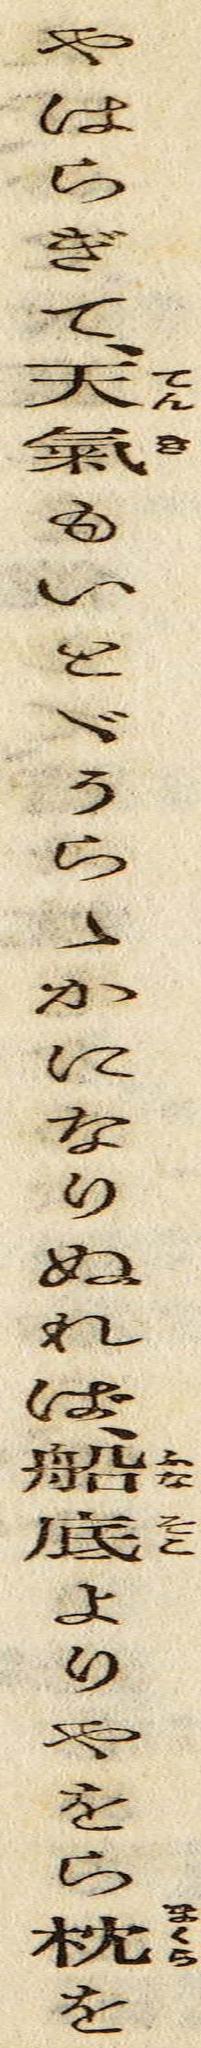やはらぎて、天気もいとヾうらゝかになりぬれば、船底よりやをら枕を
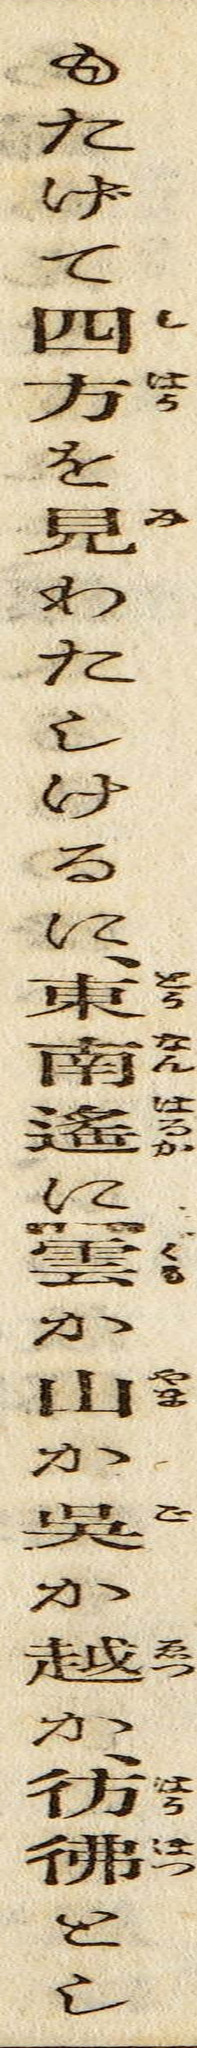もたげて四方を見わたしけるに、東南遥に雲か山か呉か越か、彷彿とし
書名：日本漂流譚
